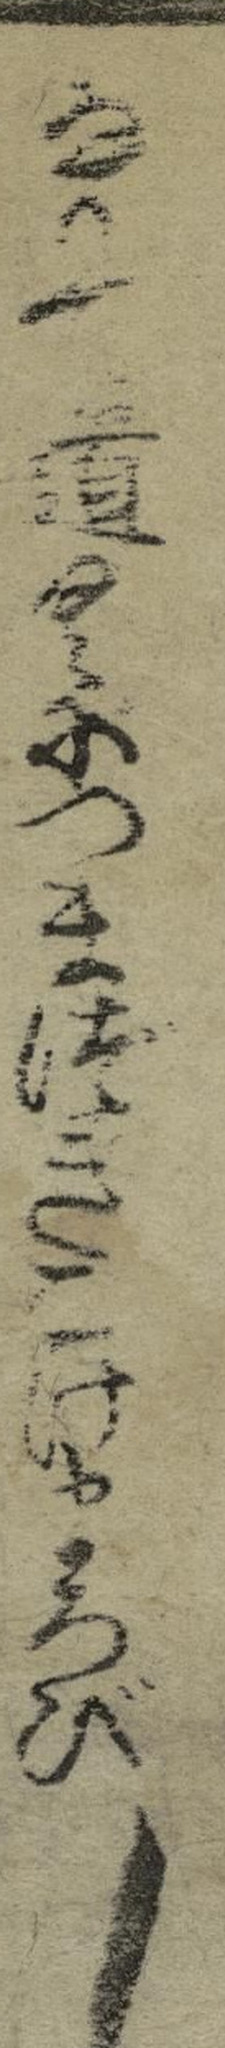なり道具につまづきこけまろび
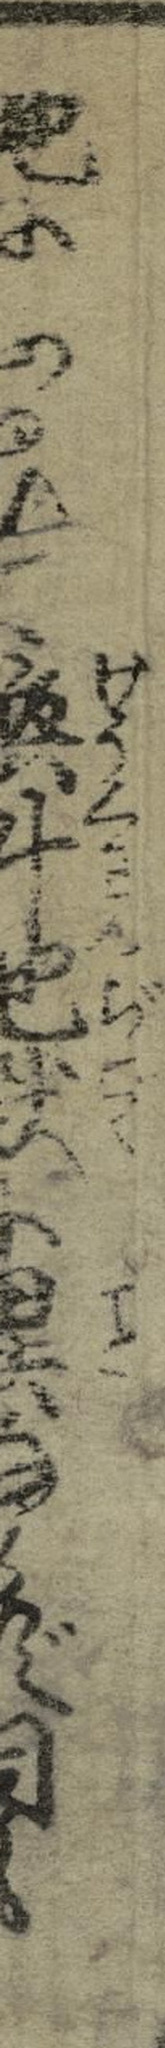地にふるひて喚叫地獄に異ならず目も
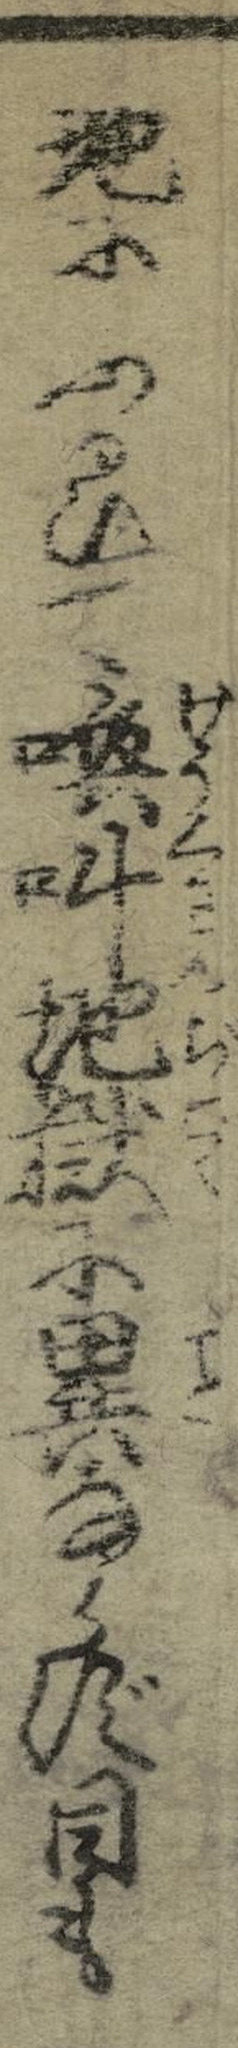地にふるひて喚叫地獄に異ならず目も
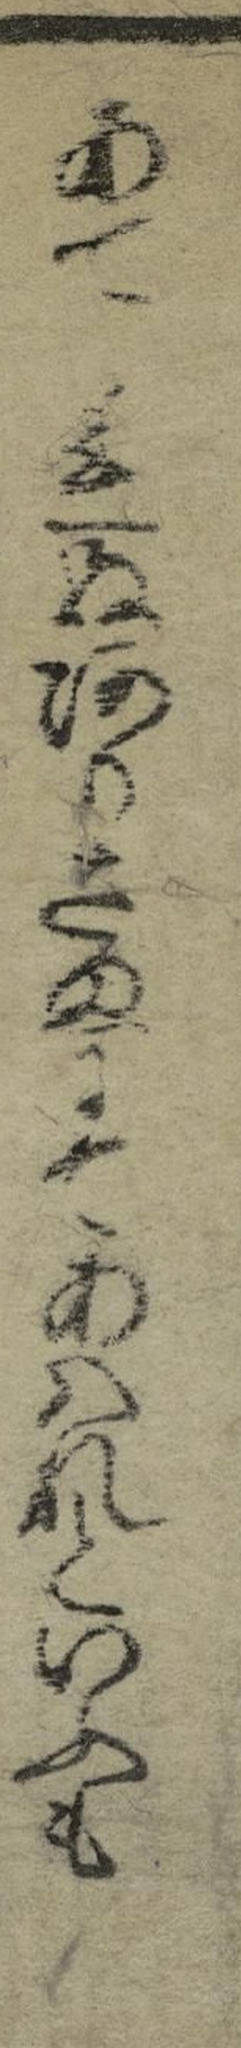あてられぬありさまにてあハれといふも
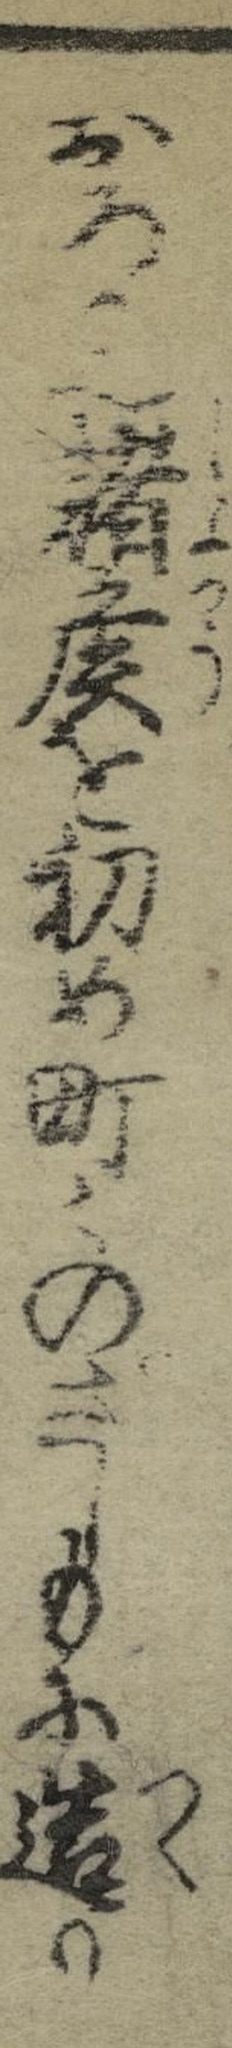おろか也諸矦を初め町々のさしもに造り
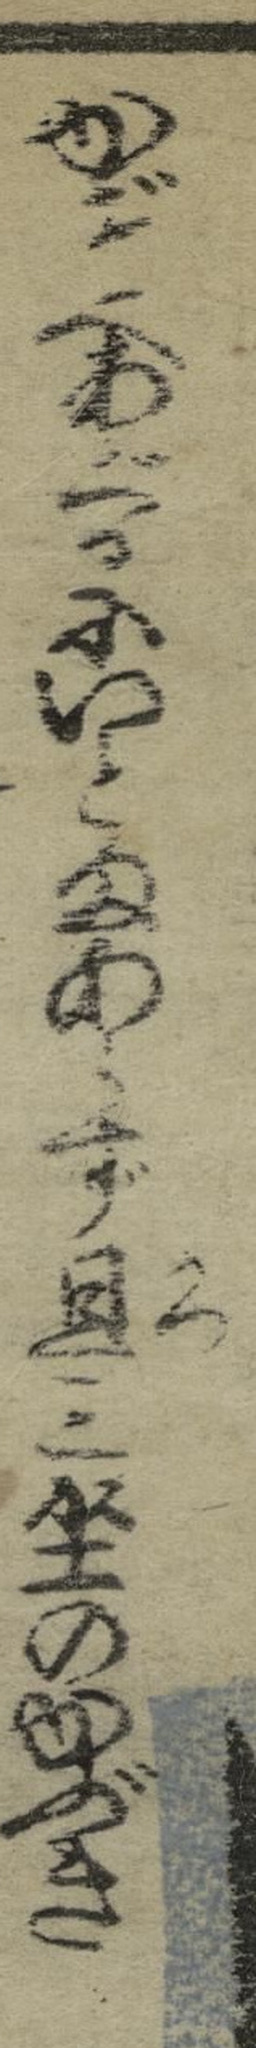かぞへるにいとまあらす且三坐のかぶき
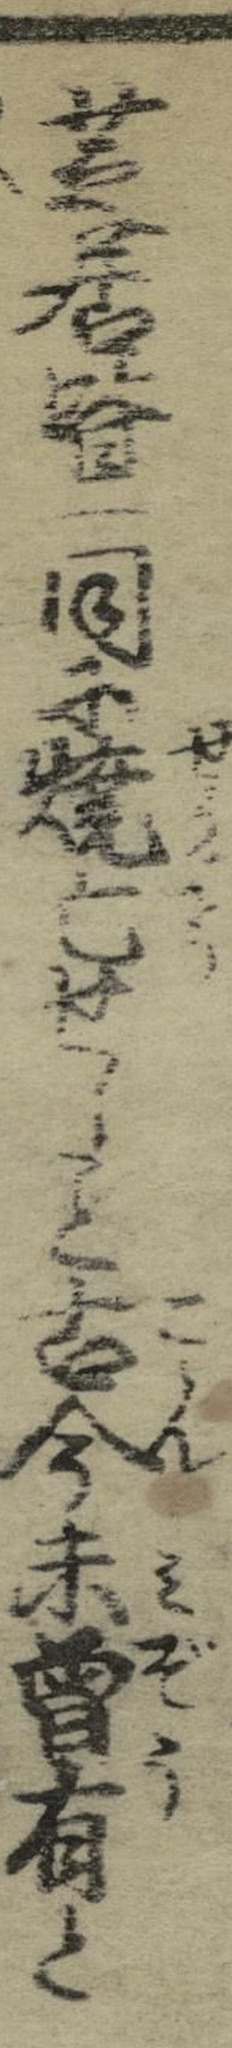芝居皆一同に焼亡せること古今未曾有と
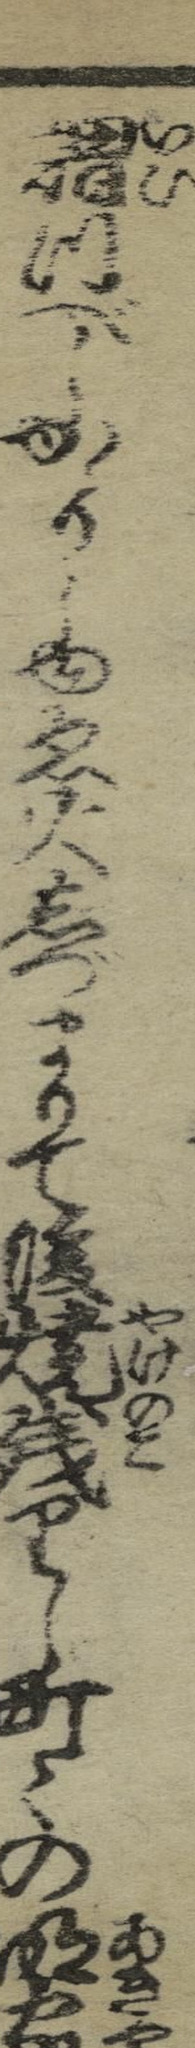謂つべかりしゆゑ火しづまりて後焼残りし町々の明家ハ
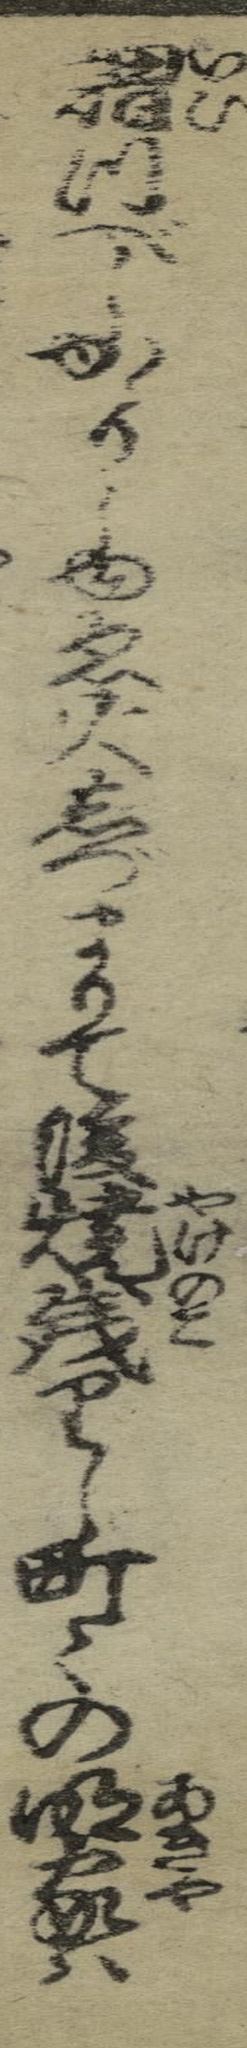謂つべかりしゆゑ火しづまりて後焼残りし町々の明家ハ
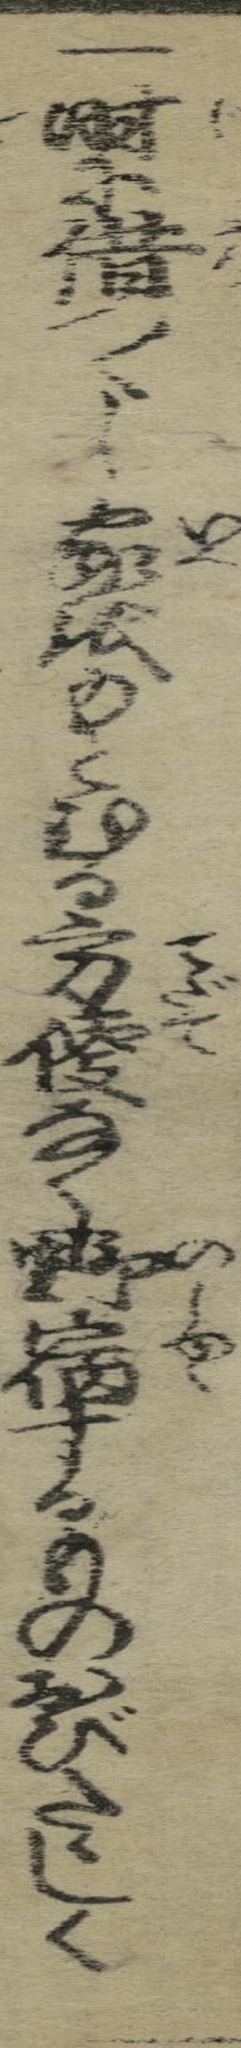一時に借つくし家をもとむる方便なく野宿するものおびたゞしく
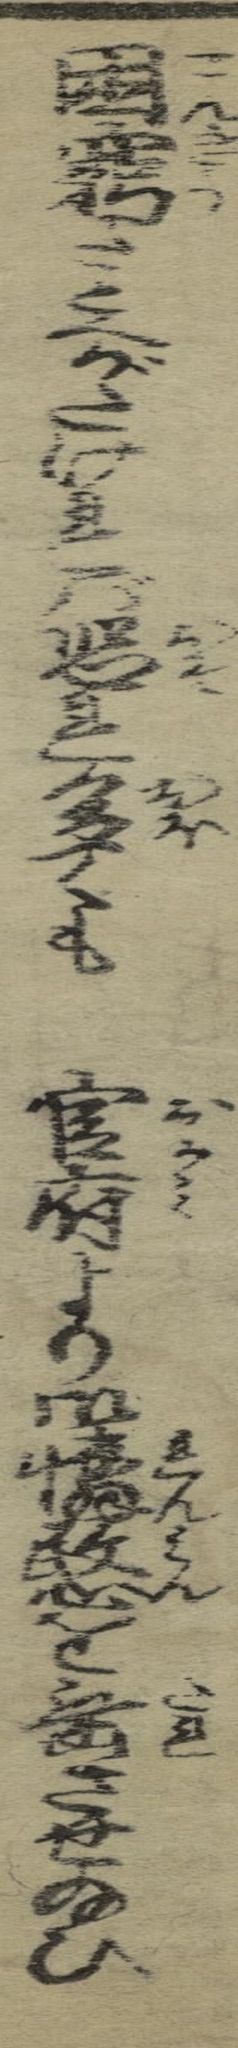困窮たとへがたけれバ恐れ多くも官府より御憐愍をさせ給ひ
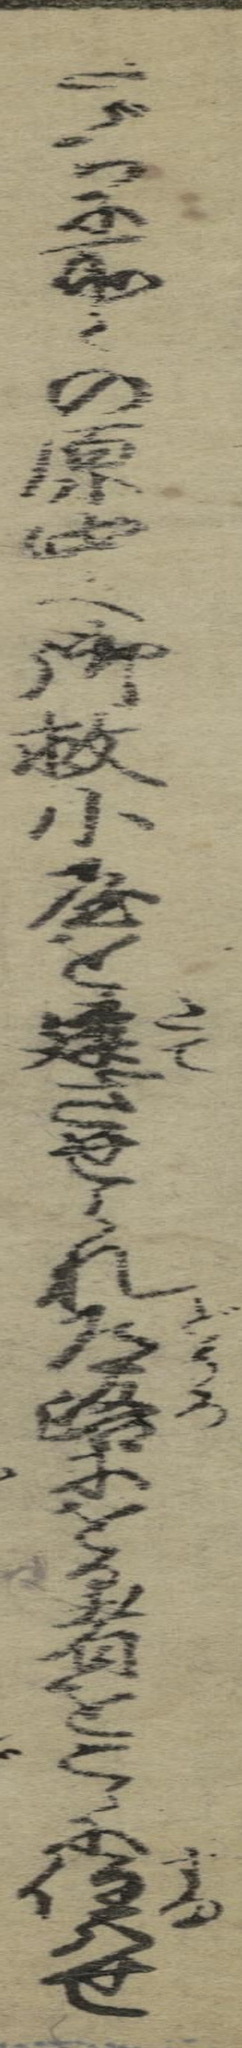こゝに所々の原中へ御救小屋を建させられ道路にをる者をこゝに住ハせ
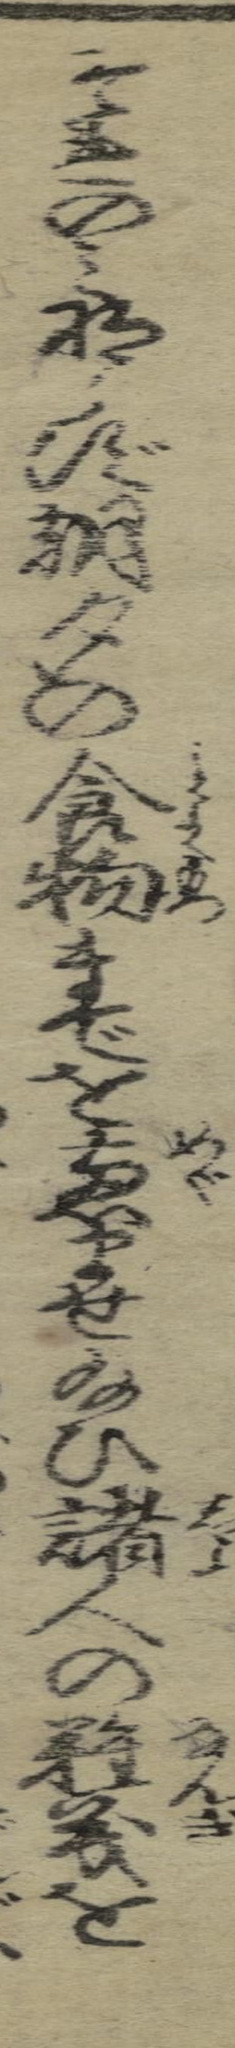それのミならず朝夕の食物までを恵ませ給ひ諸人の難義を
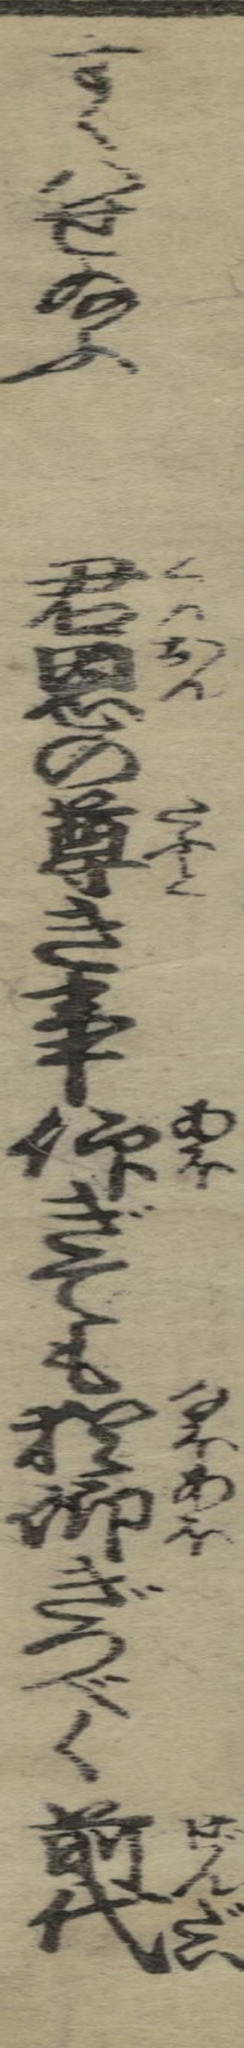すくハせ給ふ君恩の尊き事仰ぎても猶仰ぎつべく前代
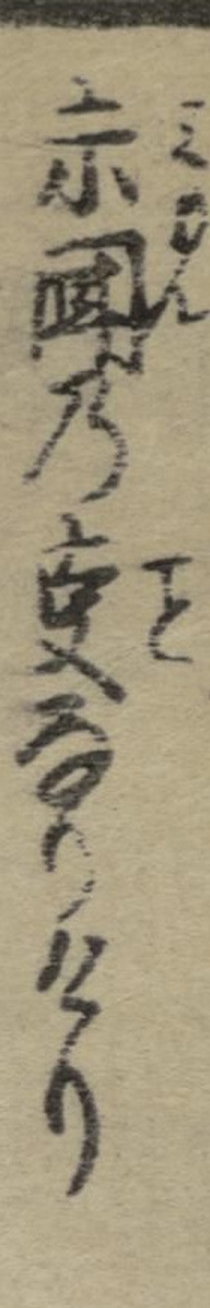未聞の事なりけり
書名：[文政十二年三月の江戸大火に関する瓦版]
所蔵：東京大学地震研究所図書室 Earthquake Research Institute Library, The University of Tokyo, JAPAN
